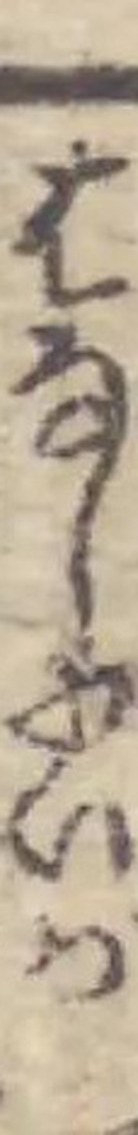はなしやいが
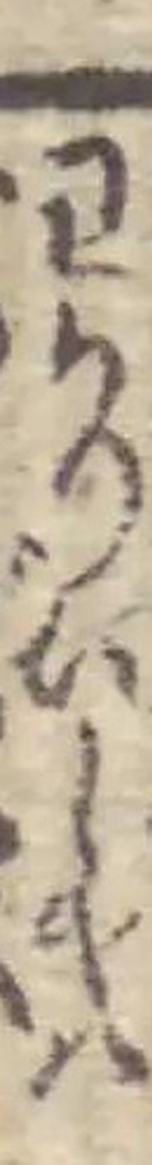わかりいしやは
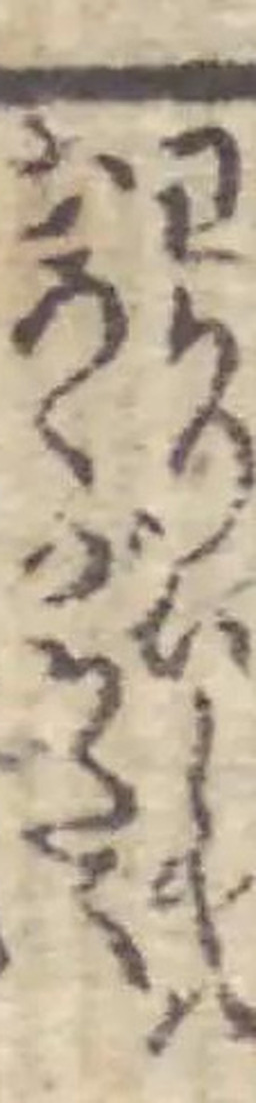おろくがかたへ
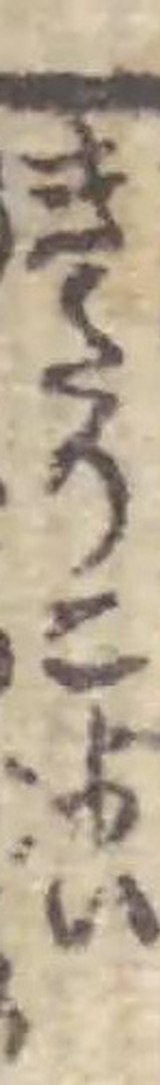きたりこよい
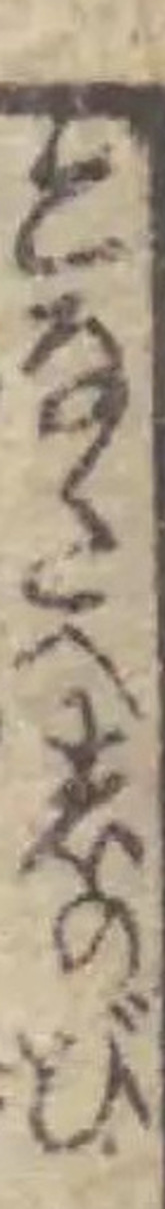こなたへしのび
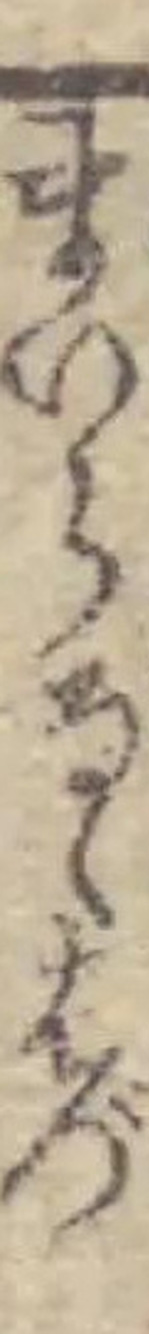まいらるゝはづ
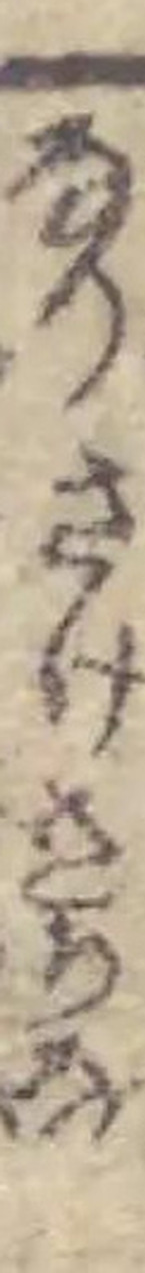なりさけさかな
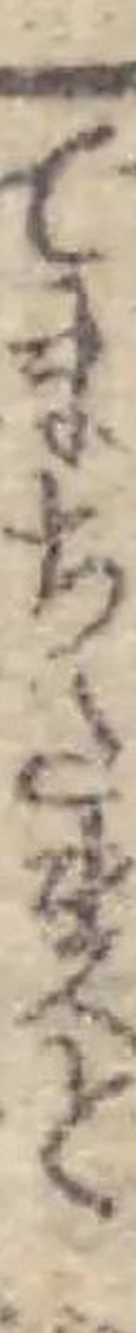てまちたまへと
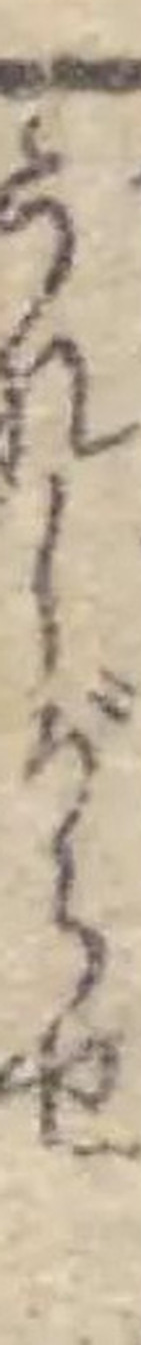うれしがらせ
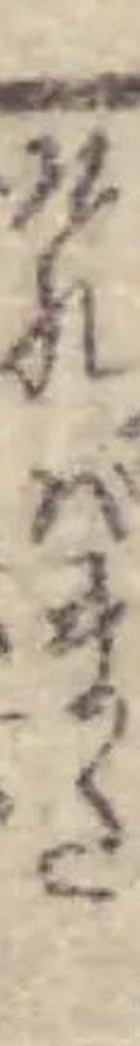ければまた
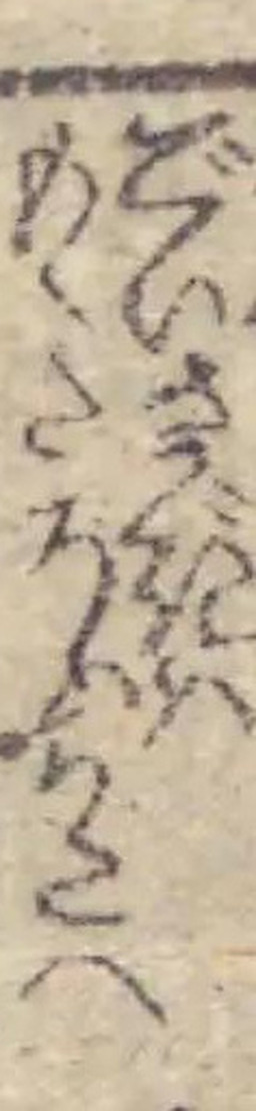もゝたろふかたへ
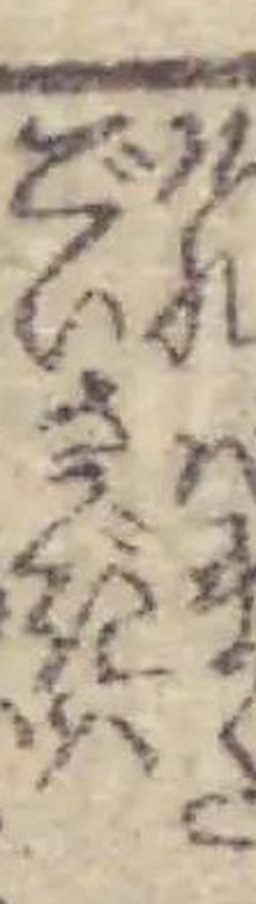ごいさぎは
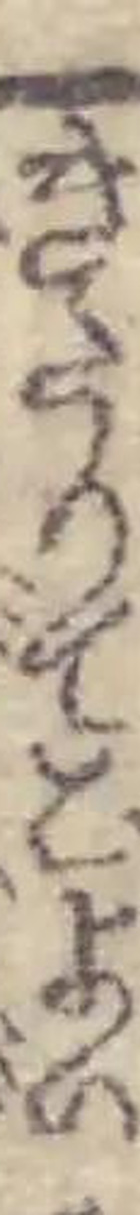きたりてこよい
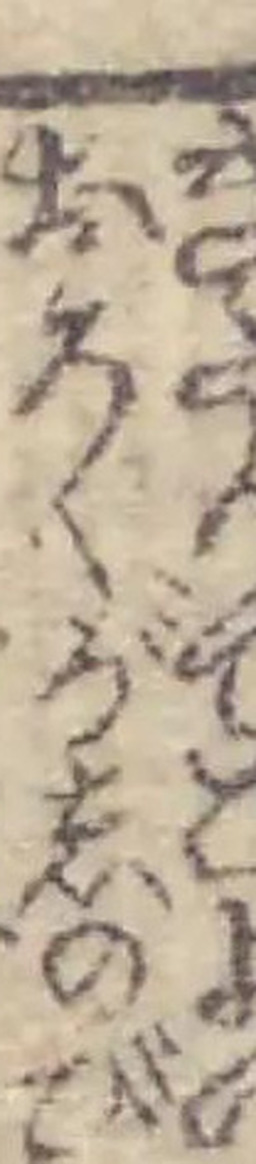おろくがしのび
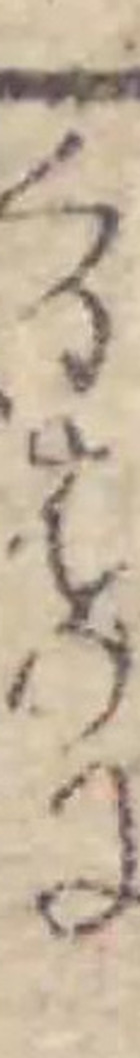くるはづに
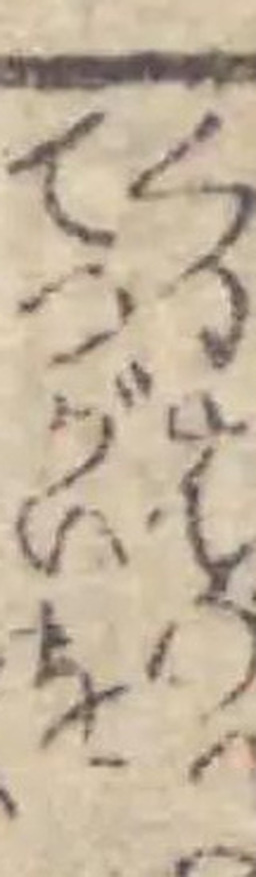てつがいを
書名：化物尽 4巻
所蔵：国立国会図書館 National Diet Library, JAPAN
